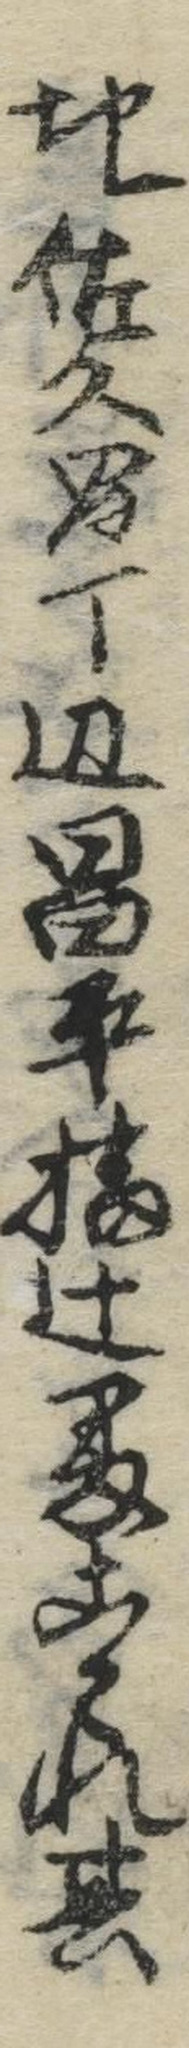地佐久間丁辺昌平橋辻番こわれ其
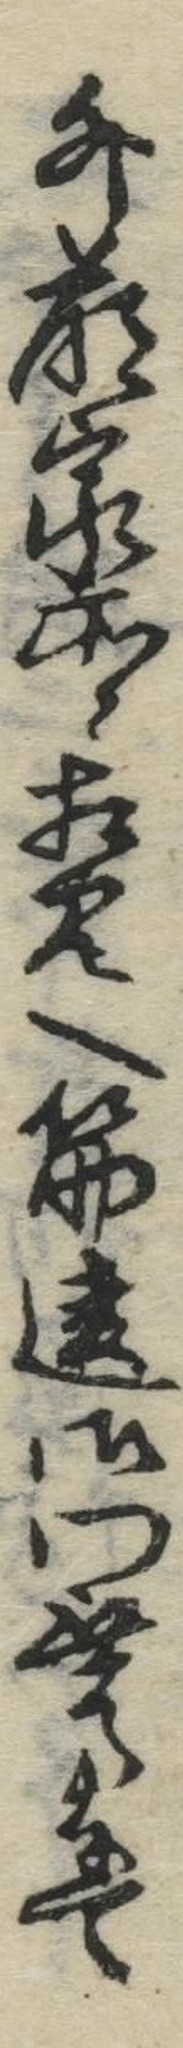外崩家所〻相見へ筋違御門無事にて
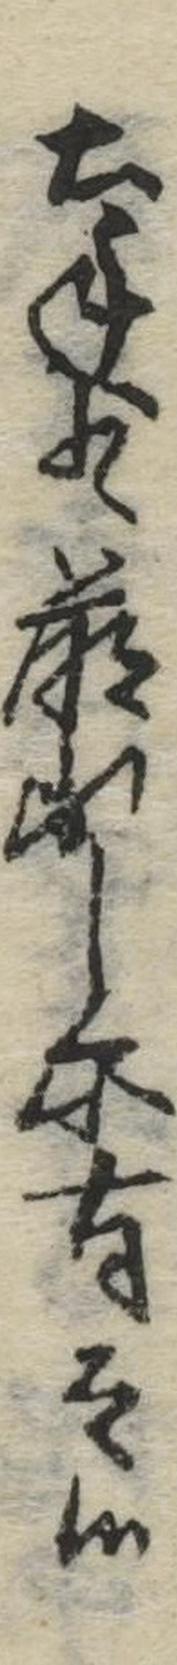土手少崩れしに有之候
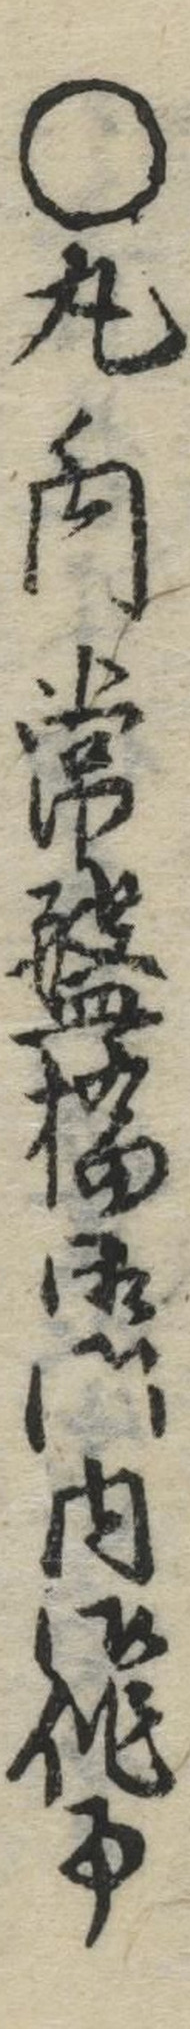○丸ノ内常盤橋御門内御作事
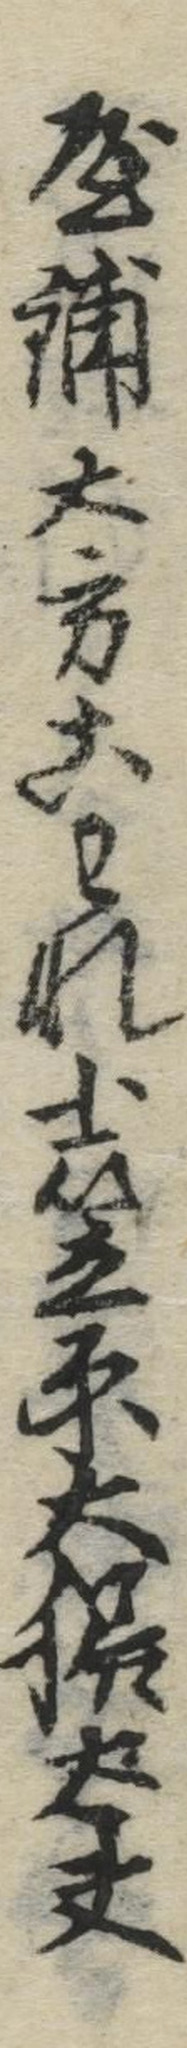屋鋪大方こわれ小笠原大膳太夫
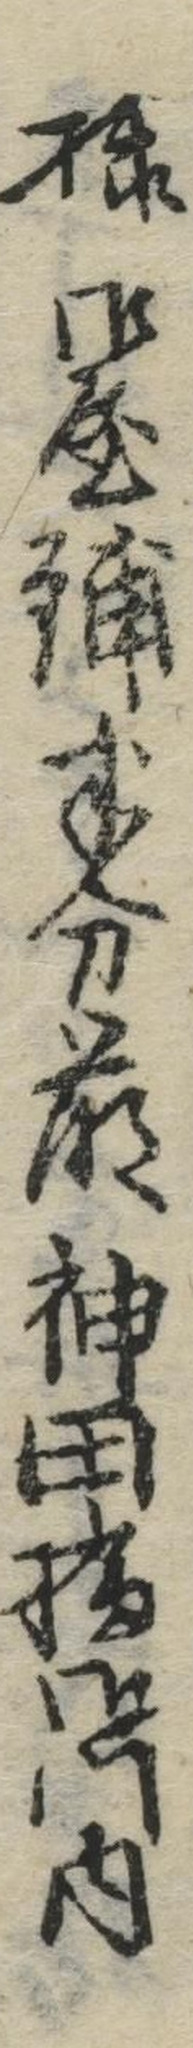様御屋鋪半分崩神田橋御門内
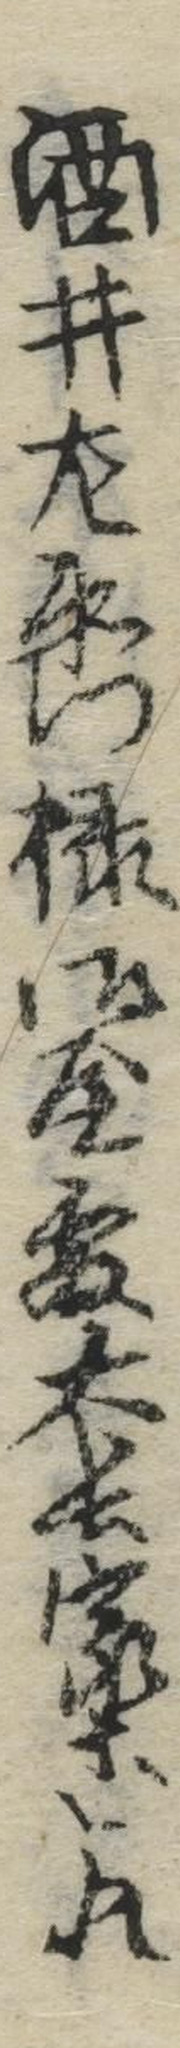酒井左衛門様御屋敷大長屋こわれ
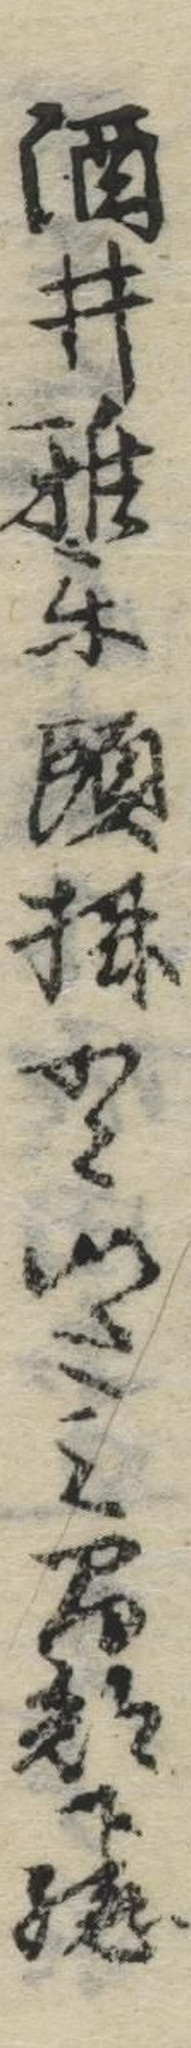酒井雅楽頭様少〻いたみ間部下総
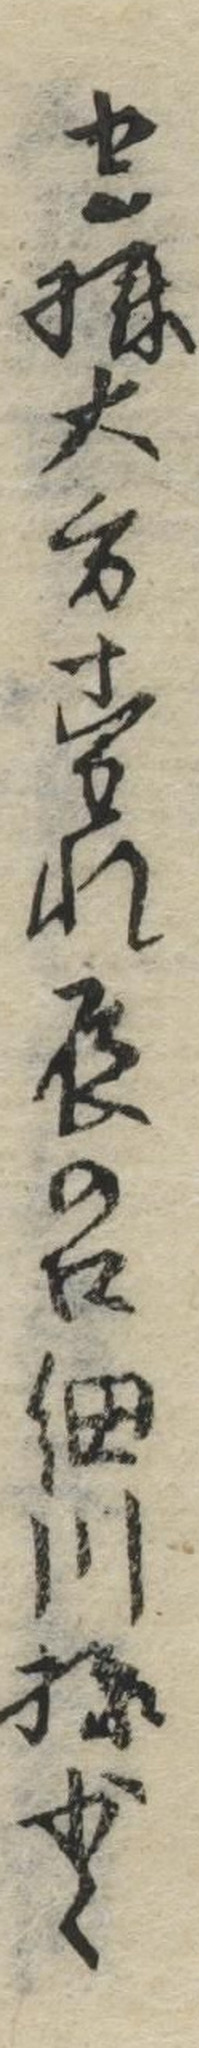守様大方こわれ辰の口細川様少〻
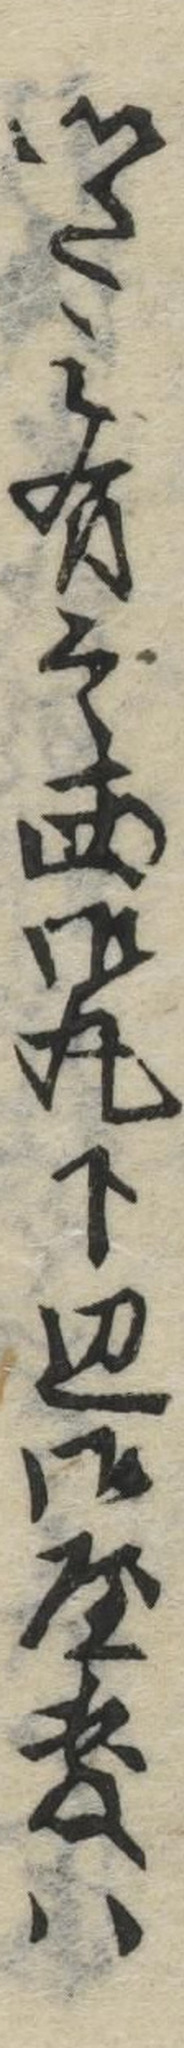いたみ之有西御丸下辺御屋敷は
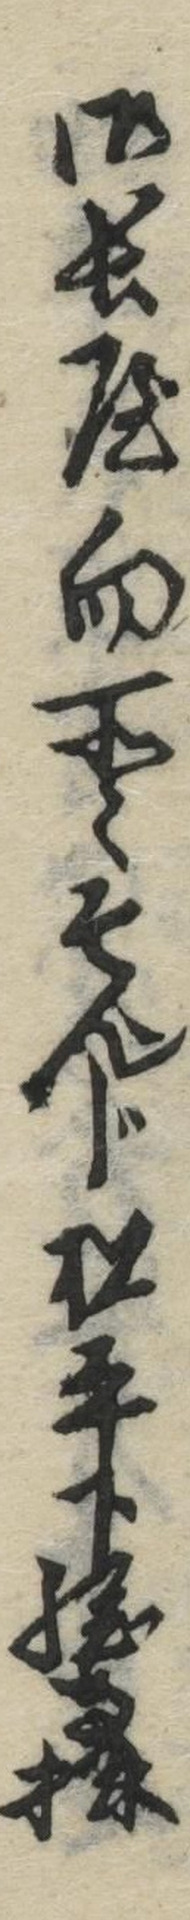御長屋向所〻そんじ松平下総守様
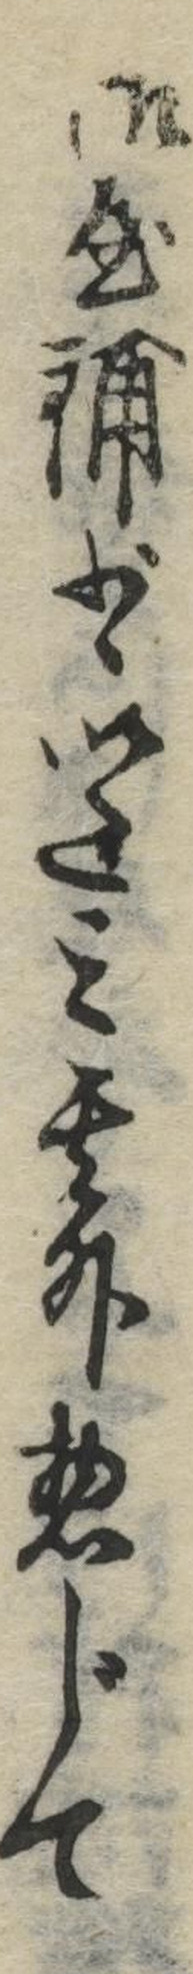御屋鋪少〻いたみ其外惣じて
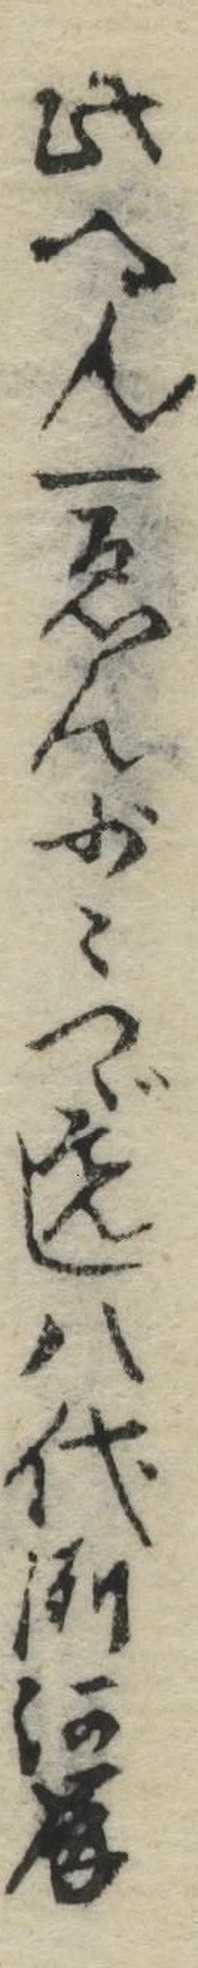此へん一ゑん少〻つヾそんし八代洲河岸
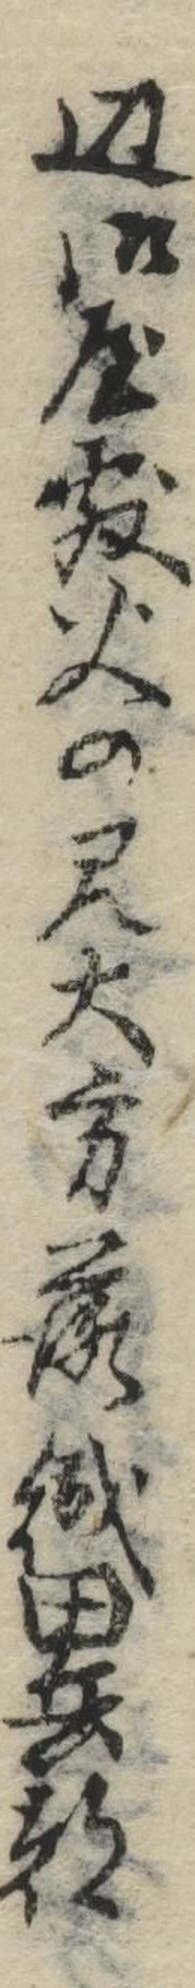辺御屋敷火の見大方落織田兵部
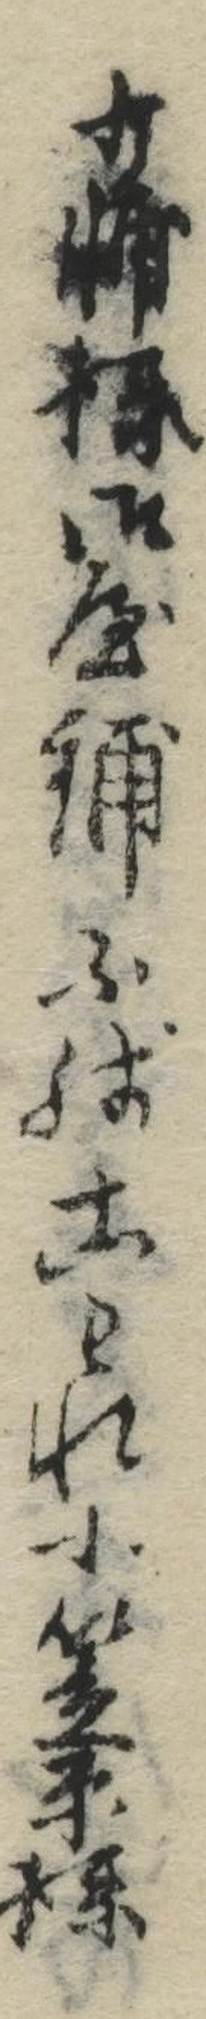少輔様御屋鋪不残こわれ小笠原様
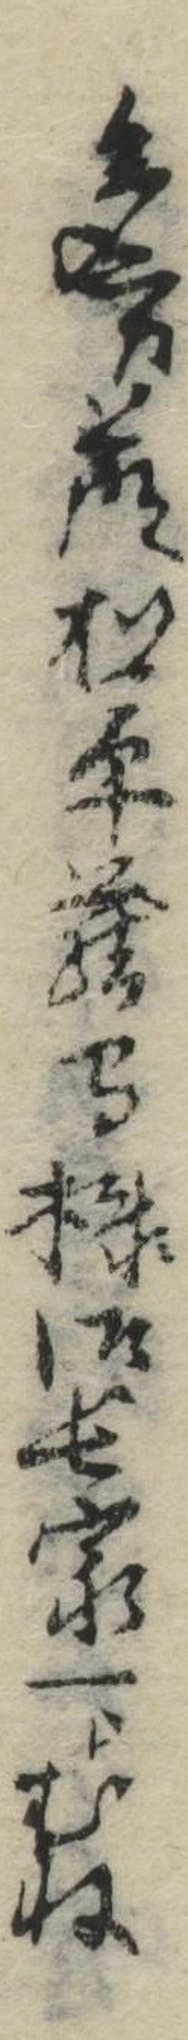多方崩松平蔵守様御長家一むね
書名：安政三年辰八月廿五日夜　大江都御屋敷方寺社市中共　大嵐水入場所明細書之寫　并街道筋近郷聞書
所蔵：東京大学地震研究所図書室 Earthquake Research Institute Library, The University of Tokyo, JAPAN
